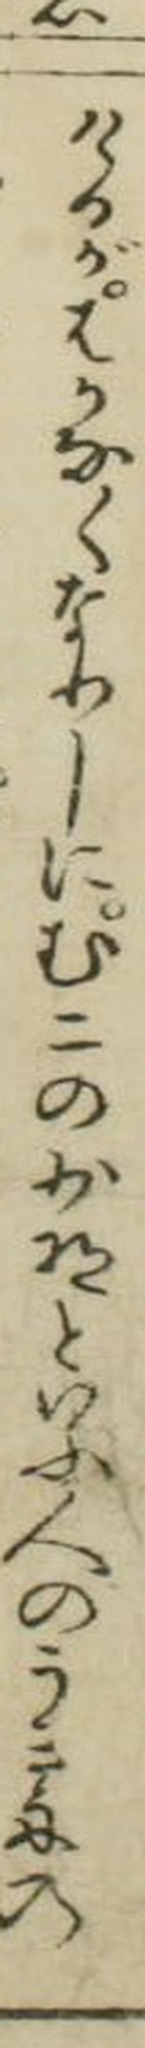けるが。はかなくなりしに。むこの少将といふ人のうき舟の
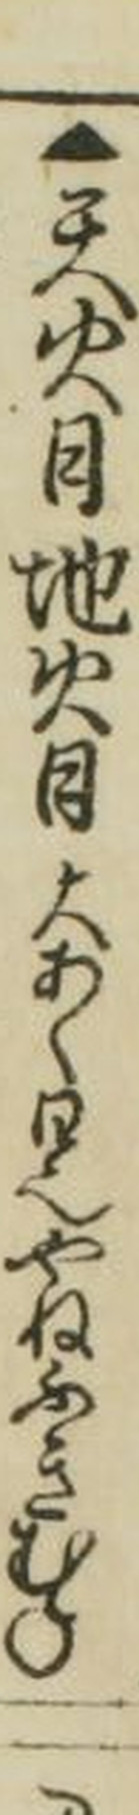▲天火日地火日大あく日也やねふきむね
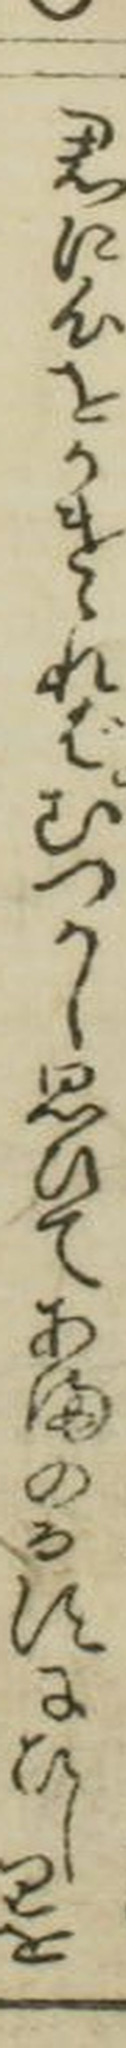君に心をかけゝれば。むつかし思ひてあまのるすにひしりを
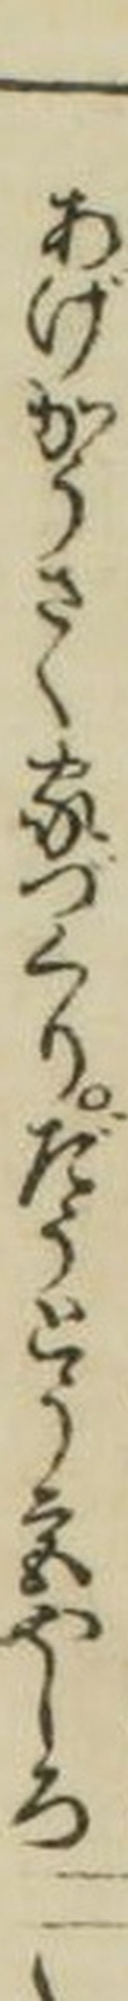あげかうさく家づくり。だうとう宮やしろ
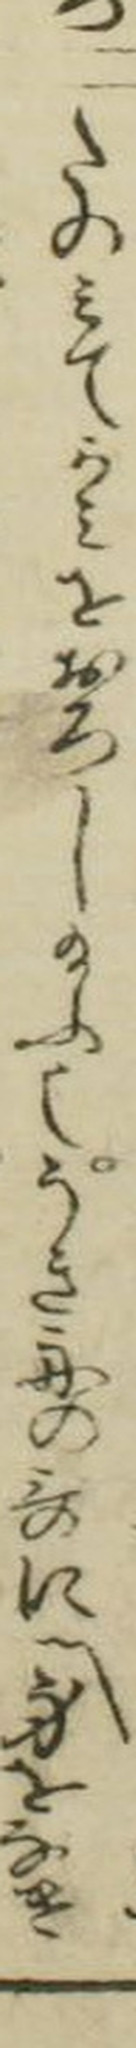たのみてかみをおろし給ふ也。うき舟の哥に〽身をなけ
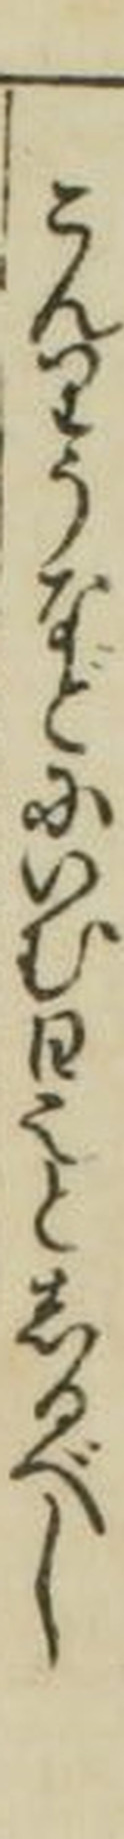こんりうなどにいむ日也としるべし
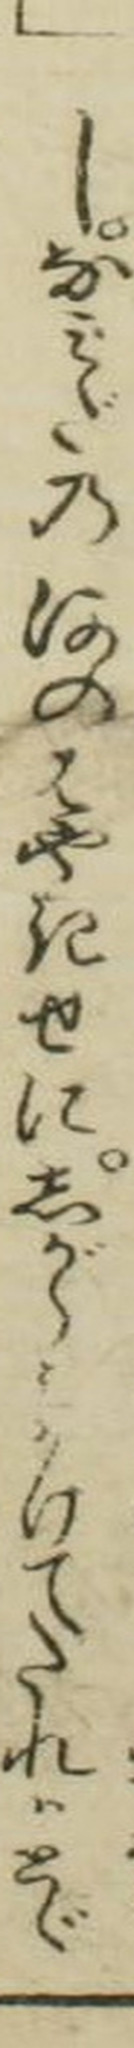し。なみだの河のはやきせに。しがらみかけてたれかとゞ
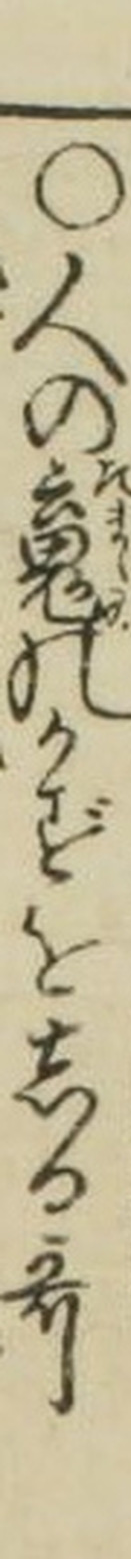◯人の魂のかずをしる哥
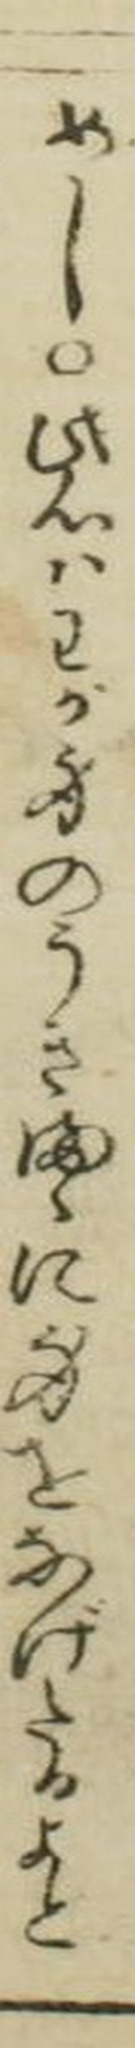めし◯此心はわが身のうきまゝに身をなげたるよと
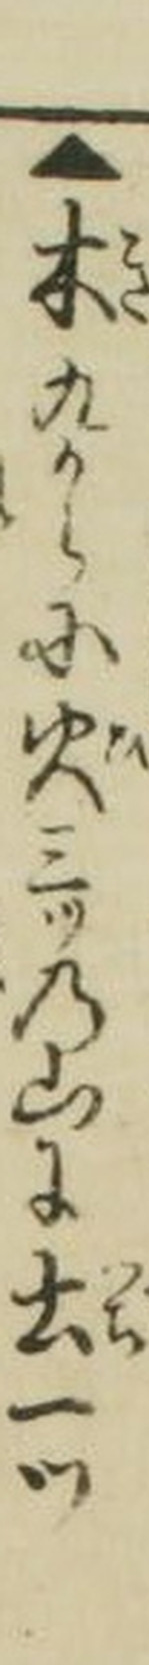▲木九からに火三ツの山に土一ツ
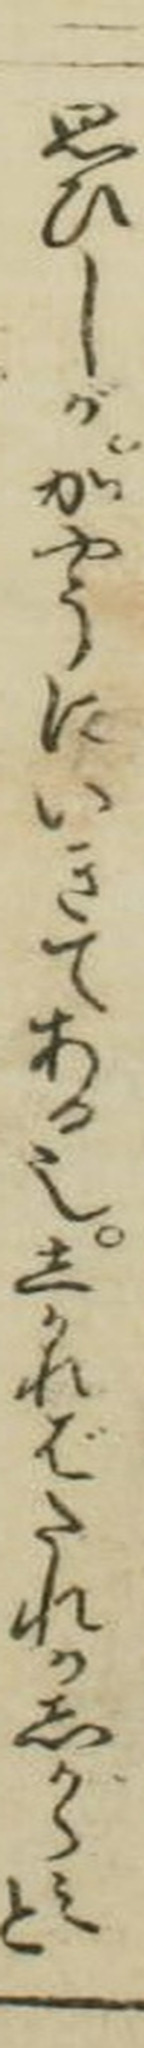思ひしが。かやうにいきてある也。しかればたれかしからみと
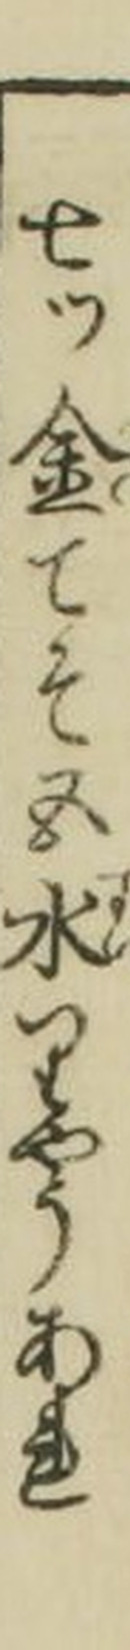七ツ金てそ五水りやうあれ
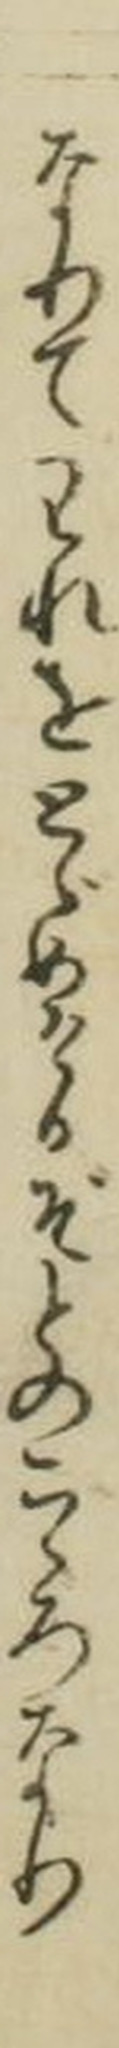なりてわれをとゞめけるぞとのこゝろなり
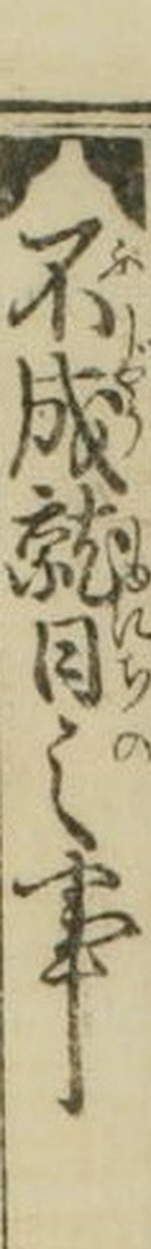不成就日之事
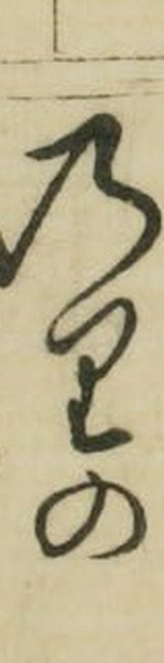のりの
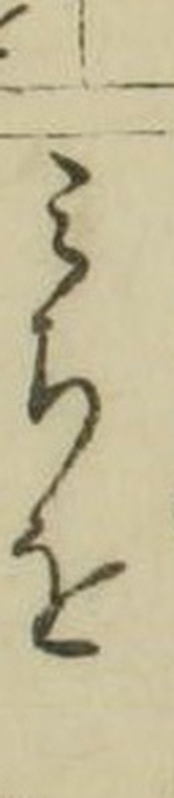みちを
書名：女源氏教訓鑑
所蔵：東京学芸大学附属図書館
